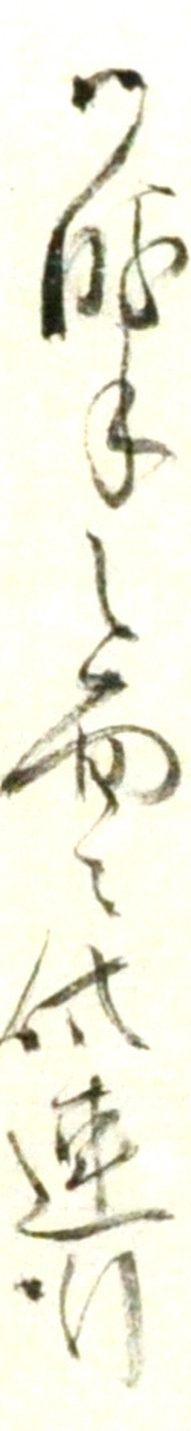御勝手之面々供連行
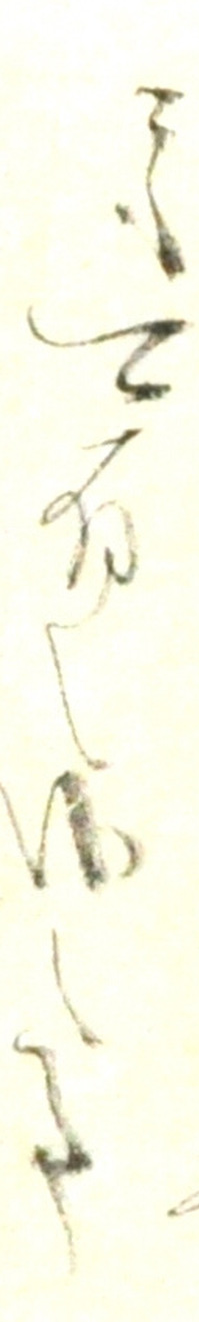にも可有之候之事

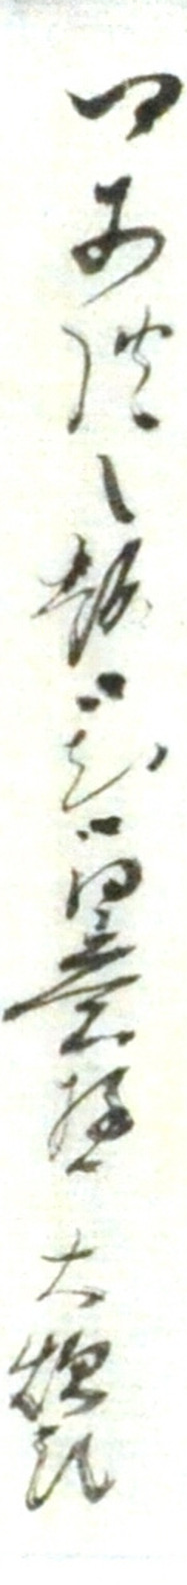御相談之趣御尤御同意存候大炊頭
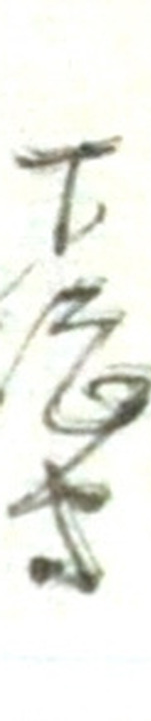下総守
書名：申合書付
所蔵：伊那市立高遠町図書館・合同会社AMANE
